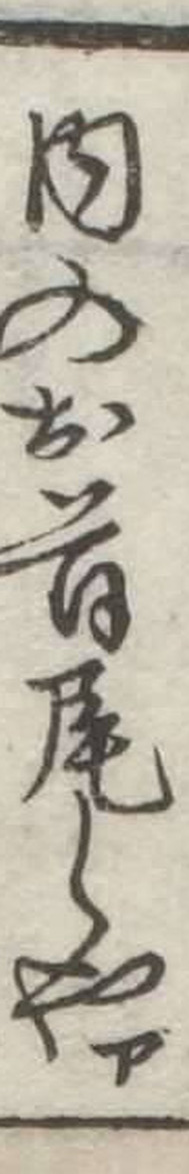内のお首尾しやあ
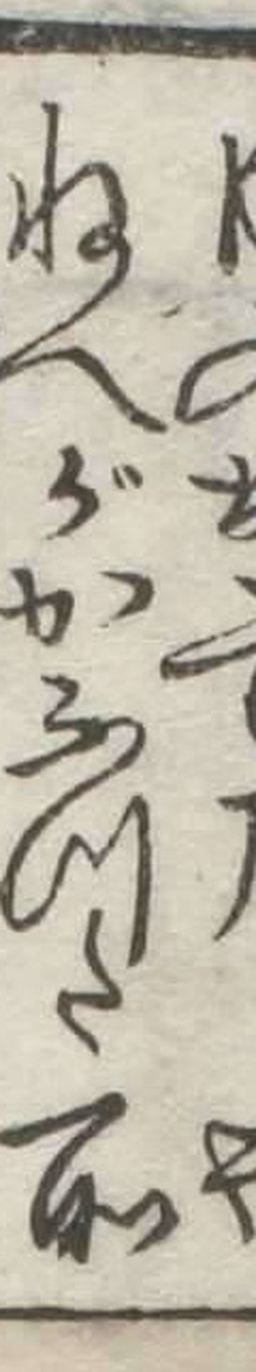ねへがかふつた所
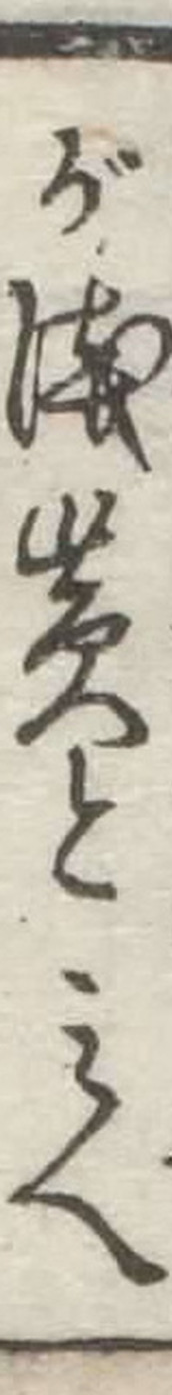が浅黄とみへ
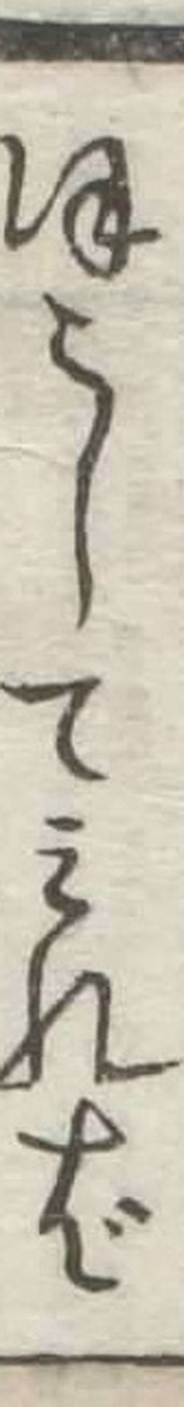ほこしてみれば
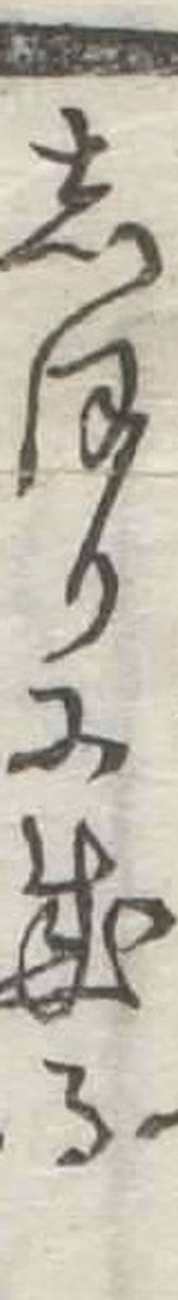しほりに成る
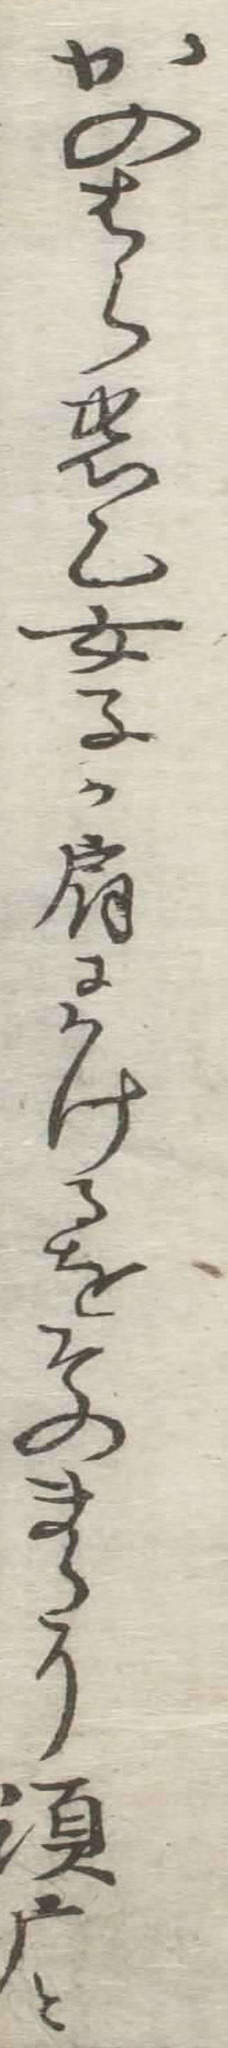かのはらの乙女子か肩にかけるをそのまゝに須磨と
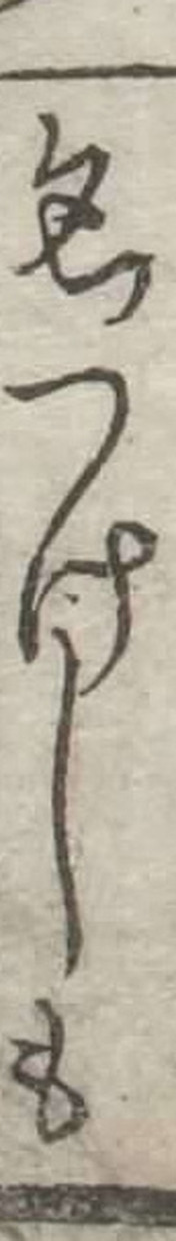名つけしも
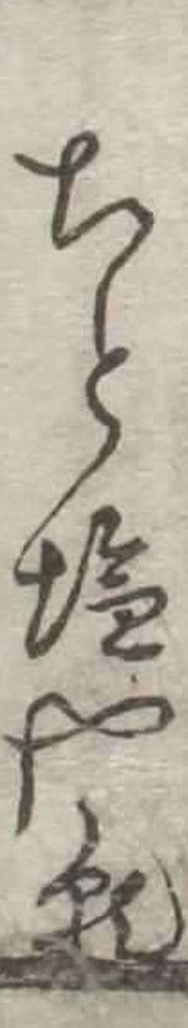ちと塩や歟
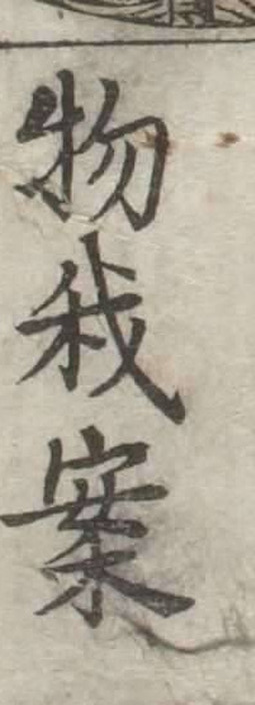物我案

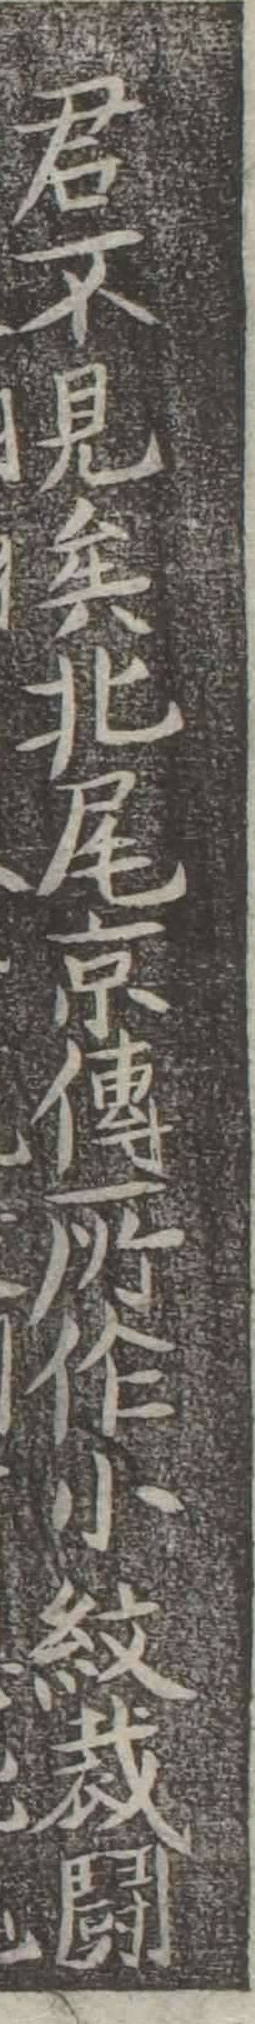君不見矣北尾京伝所作小紋裁闘
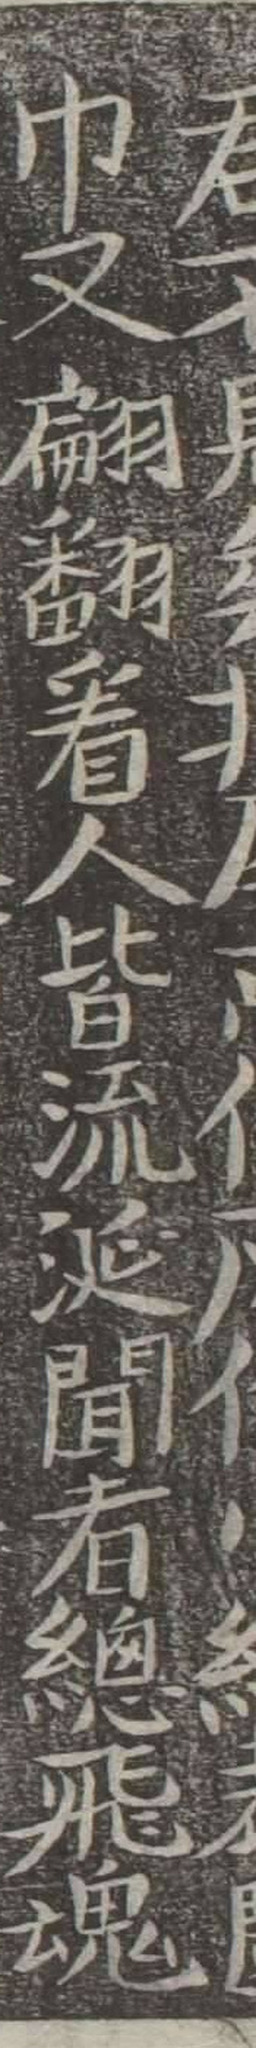巾又翩翻看人皆流涎聞者総飛魂
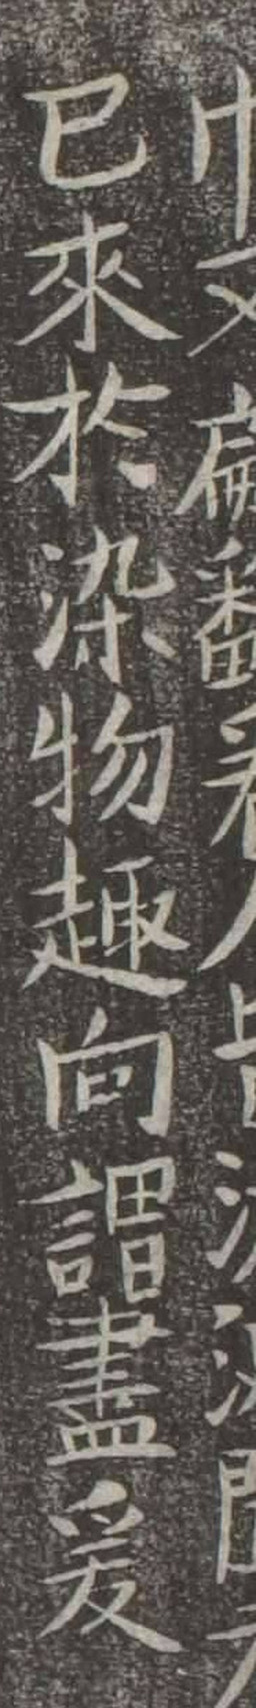已来於染物趣向謂尽爰
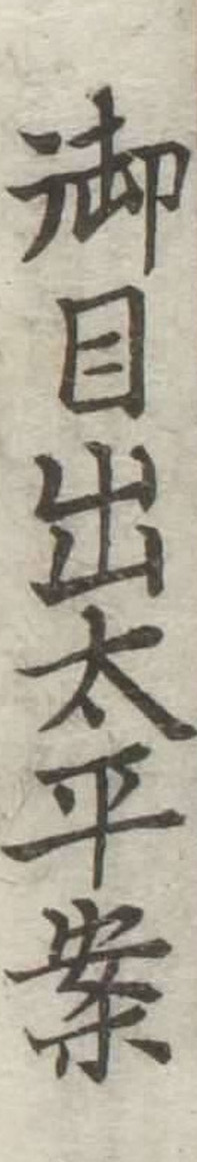御目出太平案
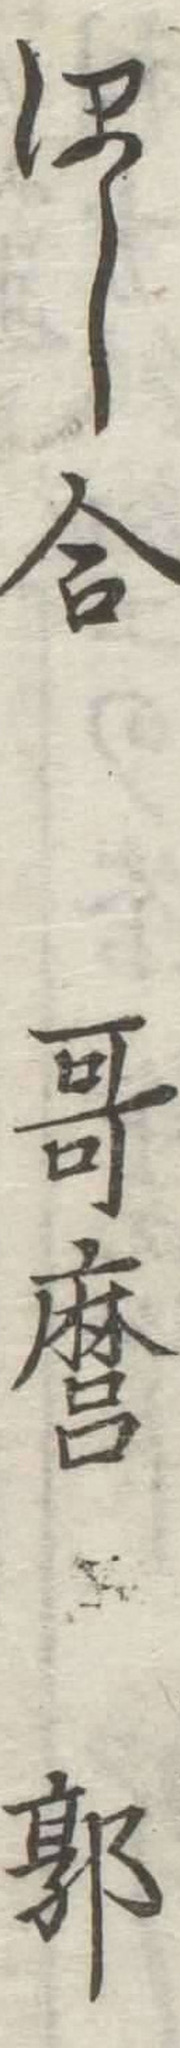ほし合歌麿
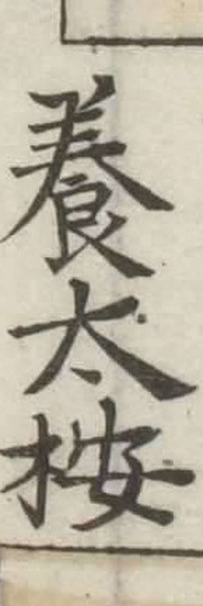養太按
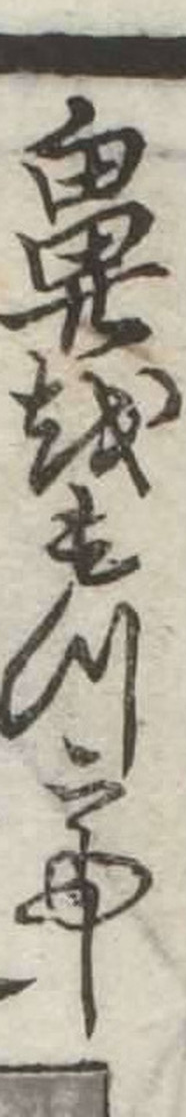鼻をもつて
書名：たなくひあわせ
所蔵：国文学研究資料館
